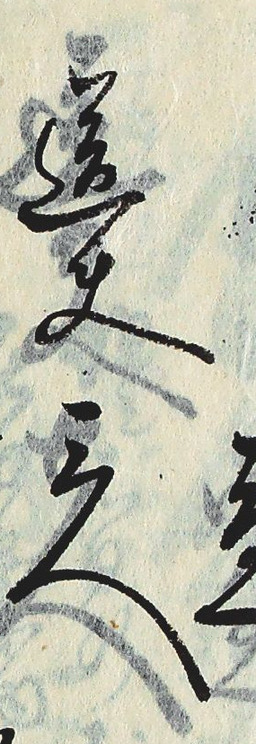送夫三人
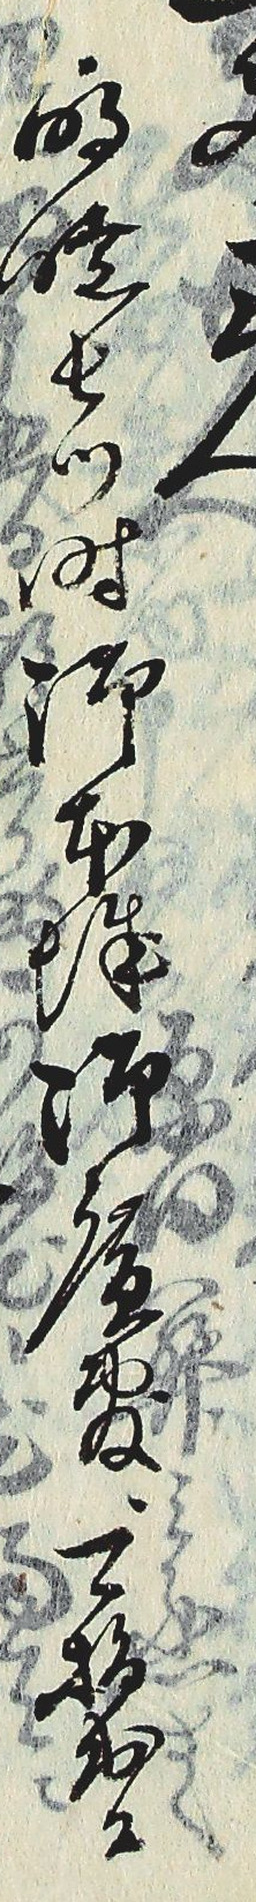明暁七つ時御本城御広敷へ可指出候
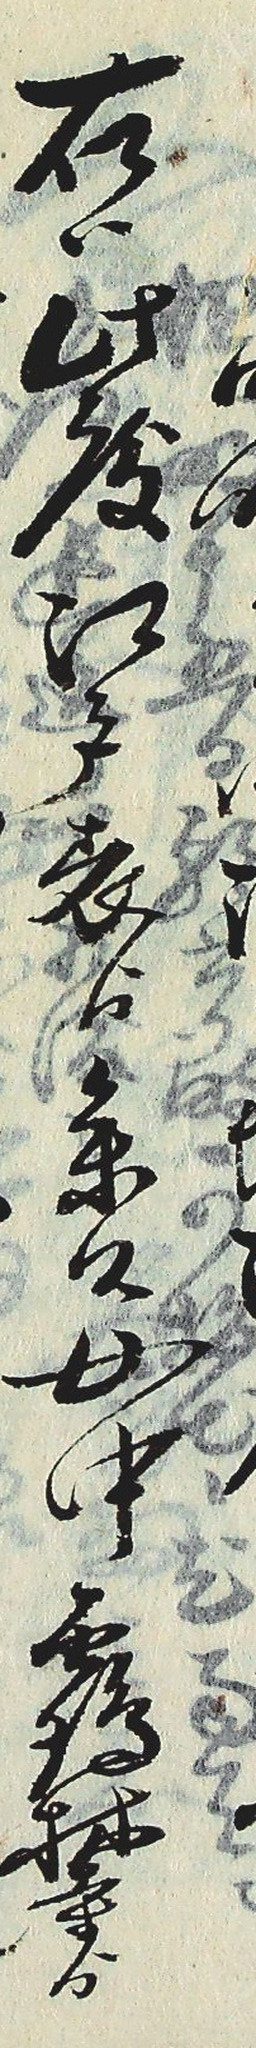右は此度江戸表ゟ参候女中鶴林寺ゟ
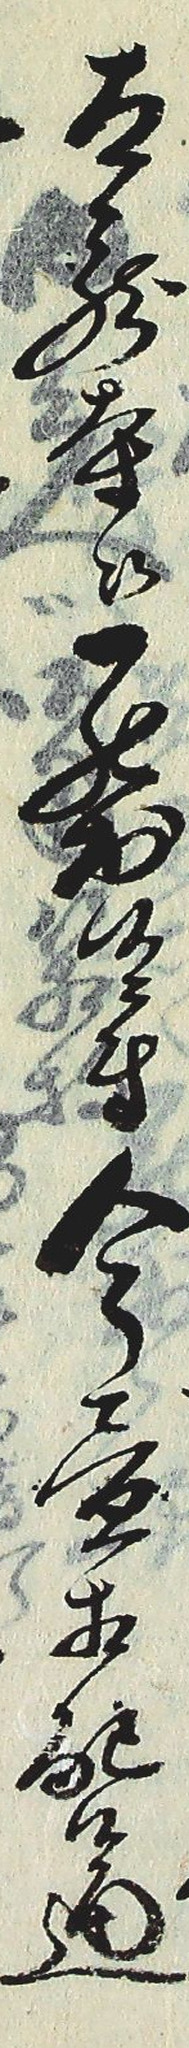太蔵寺え罷出候に付今昼相配候通
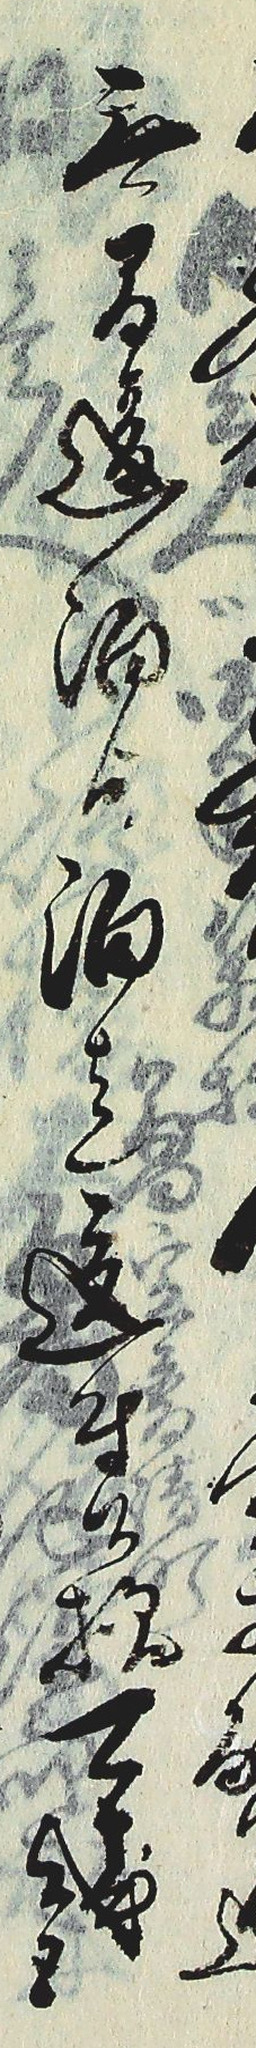無間違泊ゟ泊迄送付候様可申付候以上
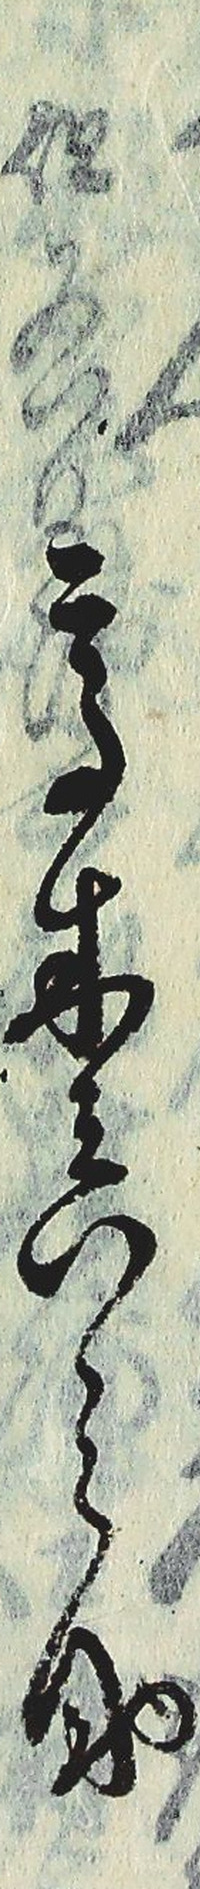高木真之助
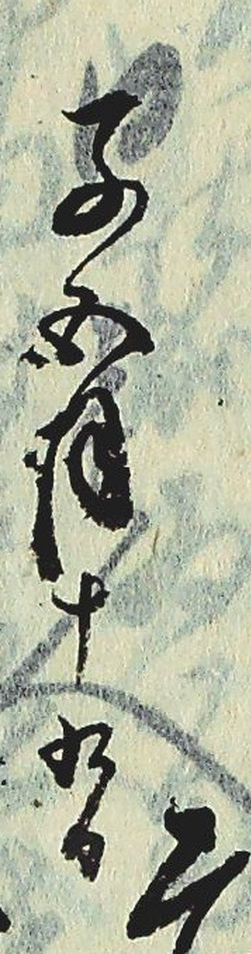子五月十九日
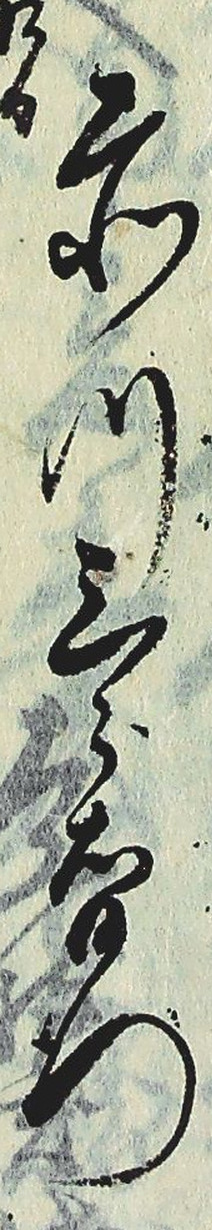赤川三郎右衛門
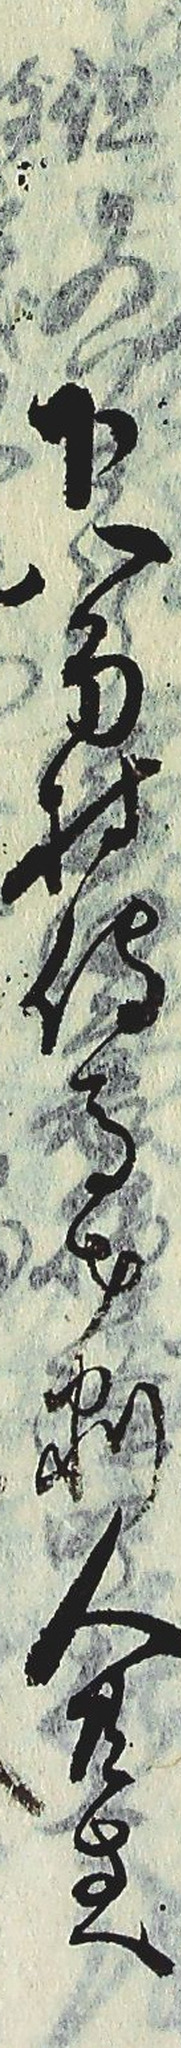下八万村伝馬才判人共方へ
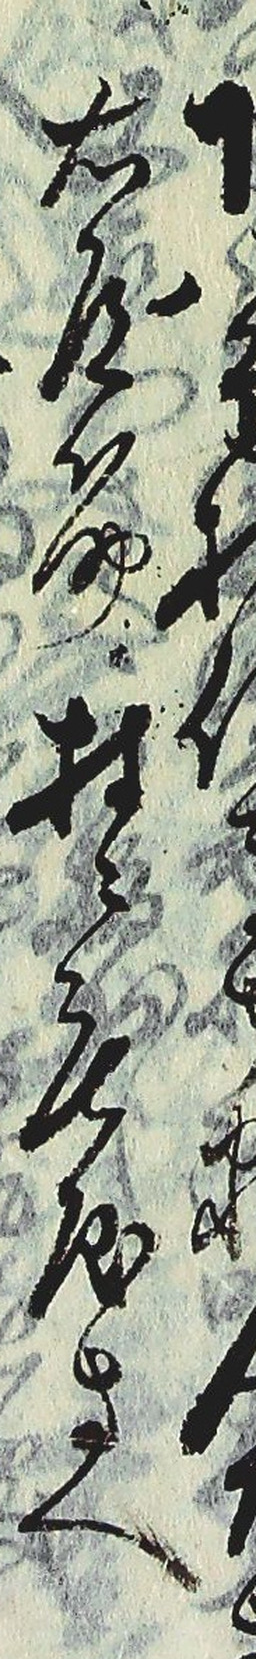右道筋村々庄屋方へ
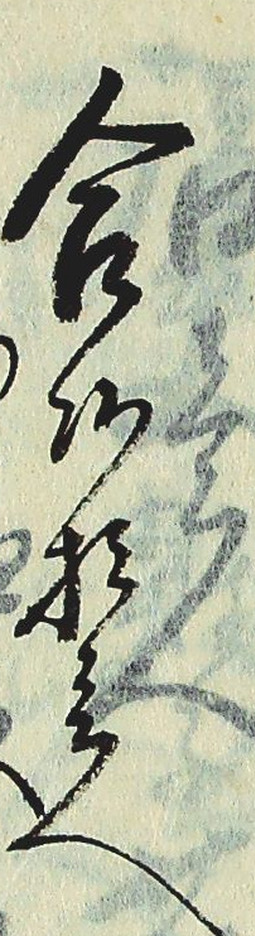合弐拾壱人
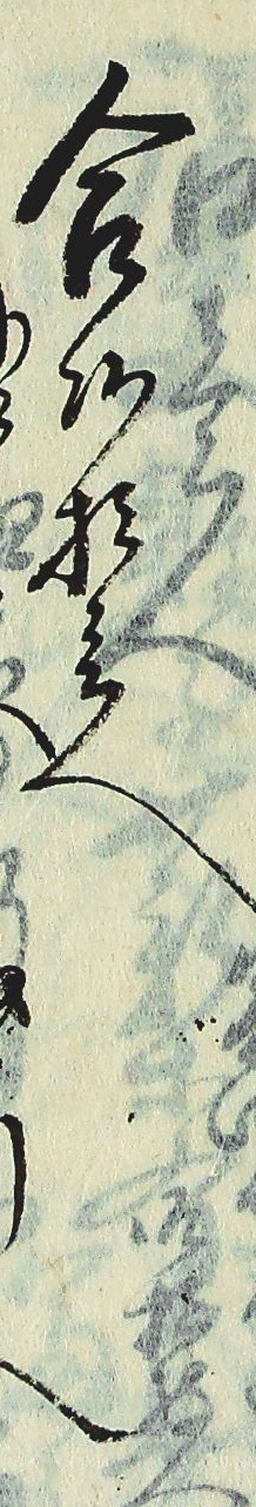合弐拾壱人
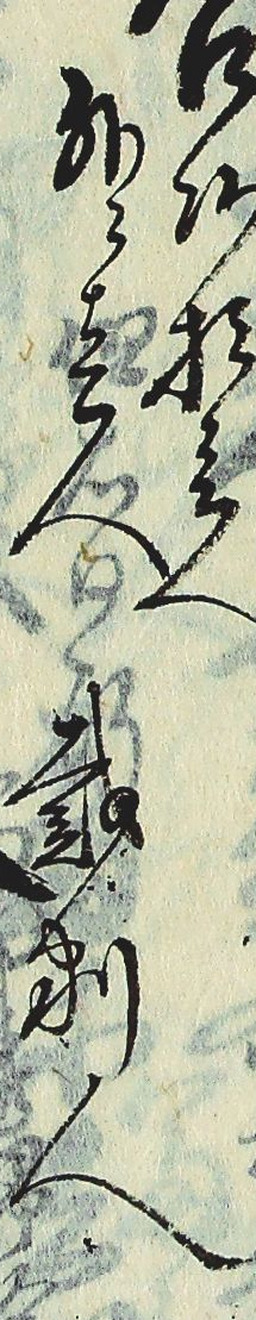外に壱人裁判人
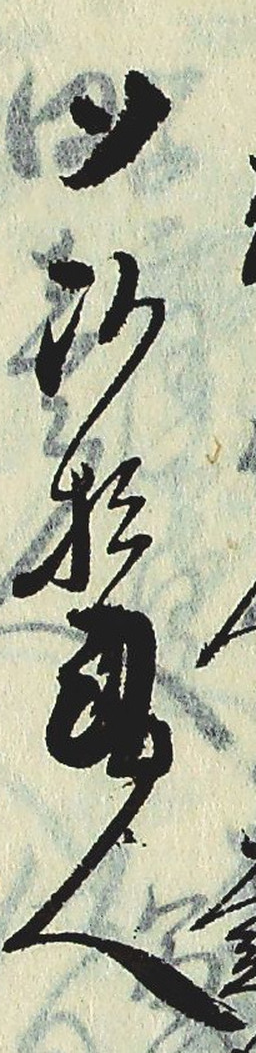〆弐拾弐人
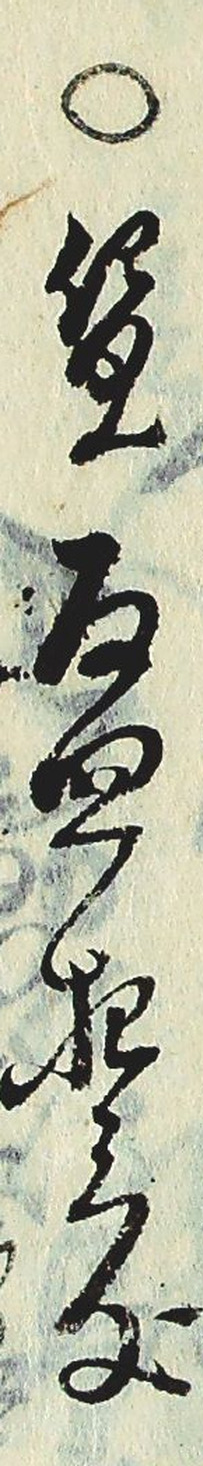賃百四拾三匁
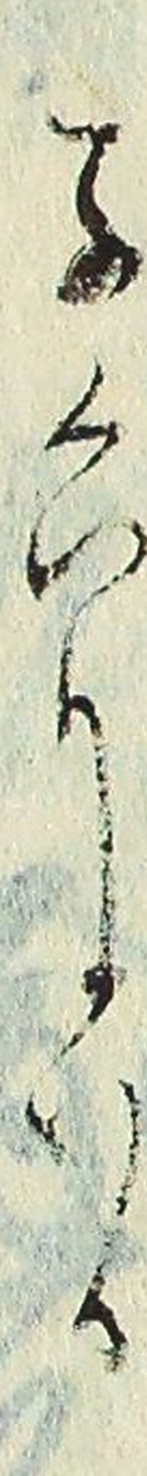子六月八日
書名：名東郡中諸割賦元帳
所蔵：鳴門教育大学 Naruto University of Education
